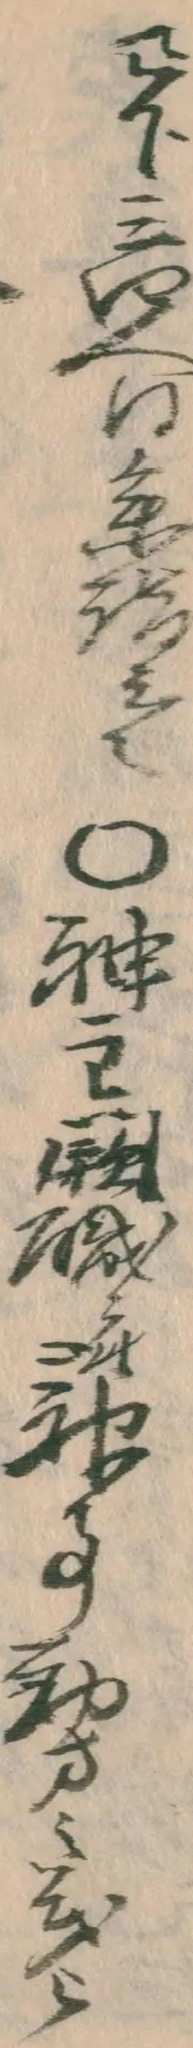已下三四人同参詣云々○神主闕職ニ付神事勤方之義被
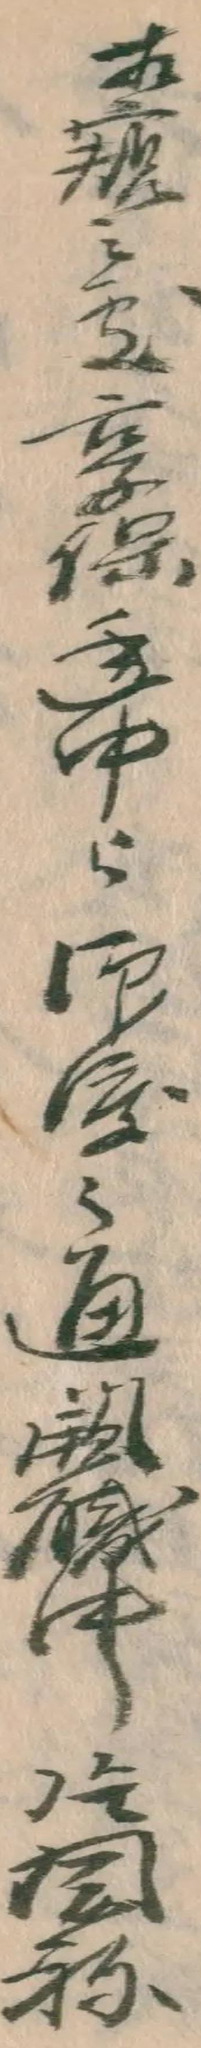相窺之處享保年中被仰渡之通闕職中片岡祢
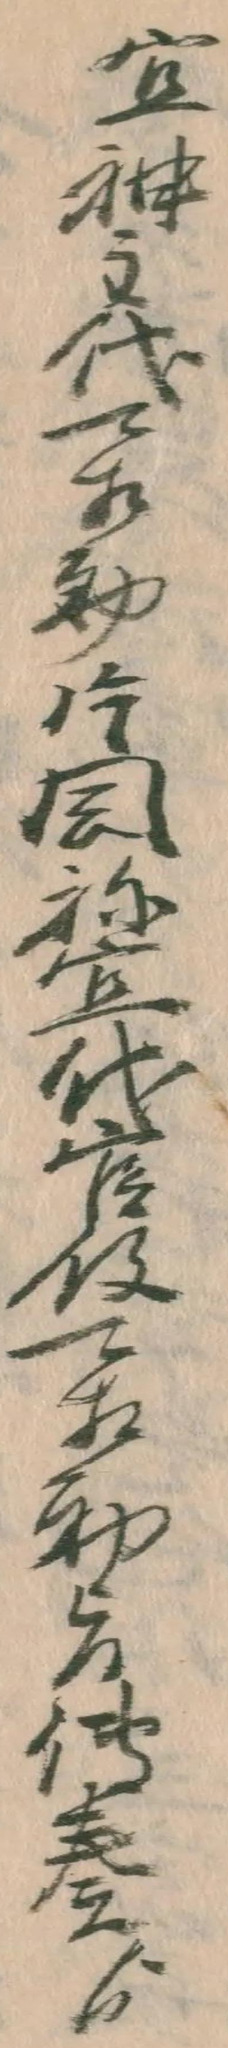宜神主代可相勤片岡祢宜代官役可相勤旨伝奏ゟ
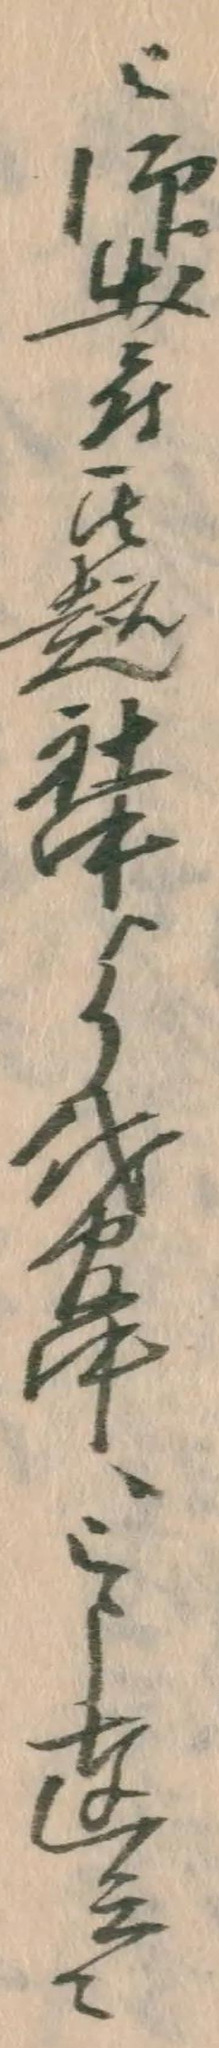被仰出ニ付其趣社中より代官中へ被申達云々
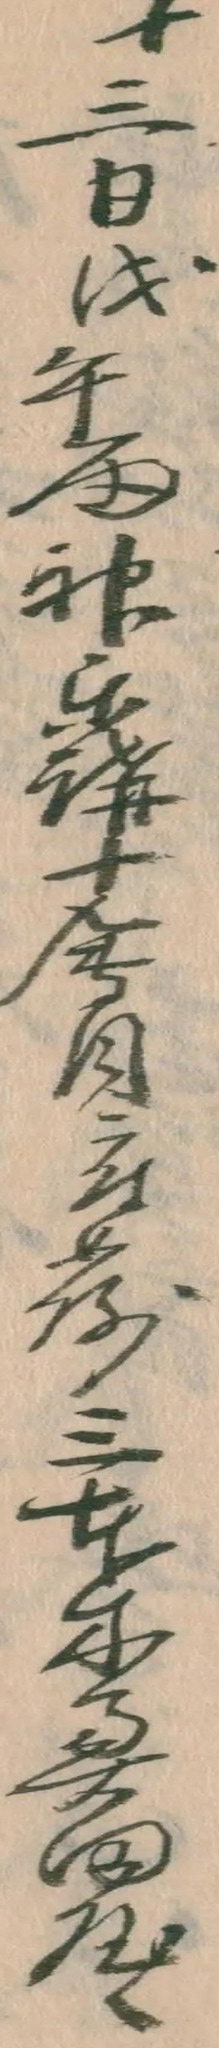十三日戊午雨神楽講十會目ニ付如例三本木奥田屋へ
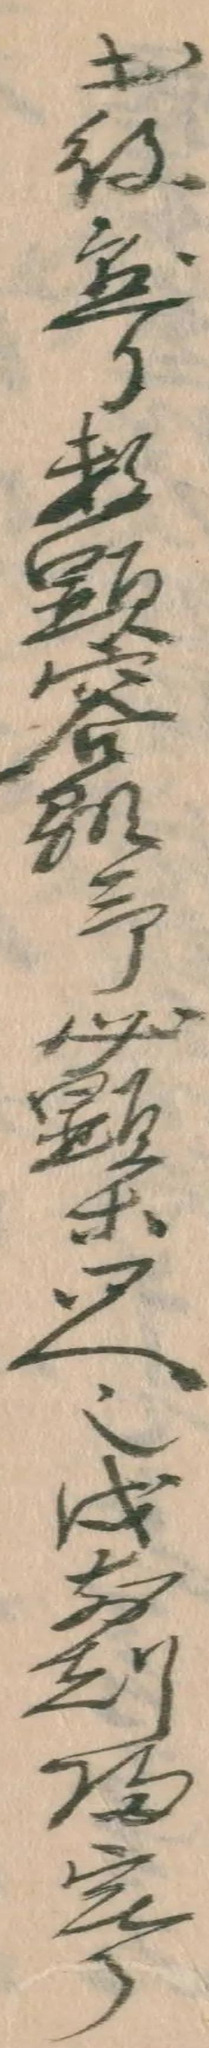出役懸り数顕容顕予必顕等四人也戌前刻帰宅了
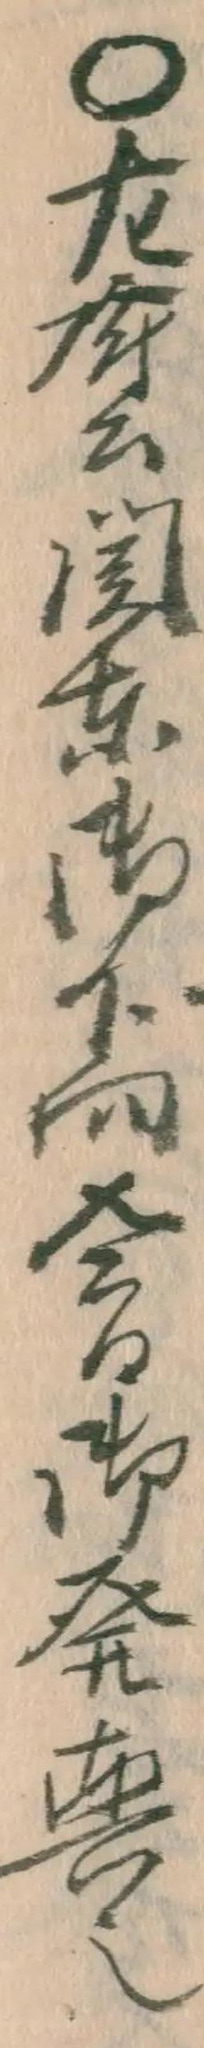○左府公関東御下向今日御発輿也
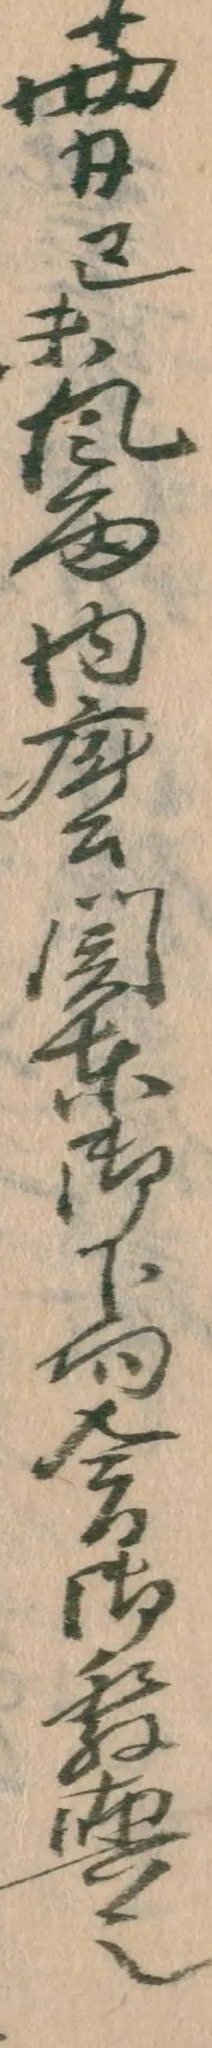十四日巳未風雨内府公関東御下向今日御発輿也
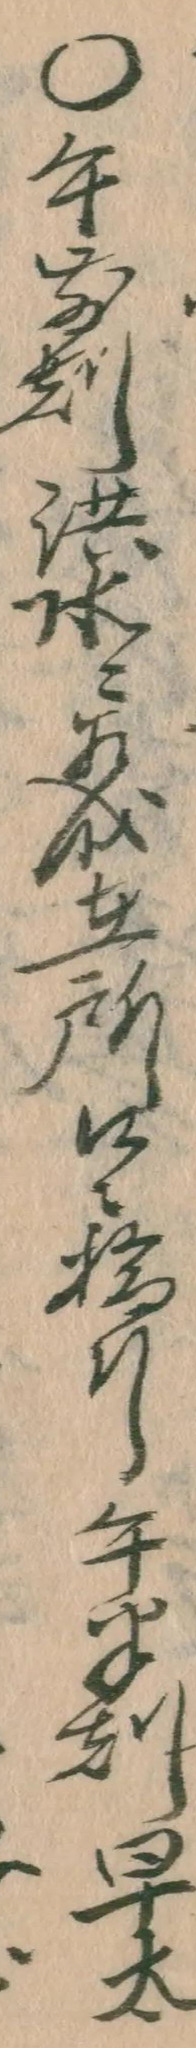○午前刻洪水ニ相成在所口〻橋引午半刻早太
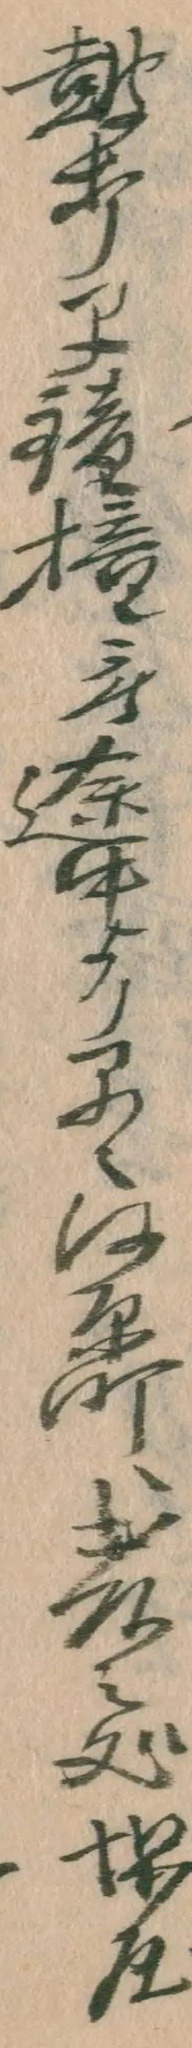皷打早鐘櫓ニ付途中より早々河原町へ出役之処堺屋
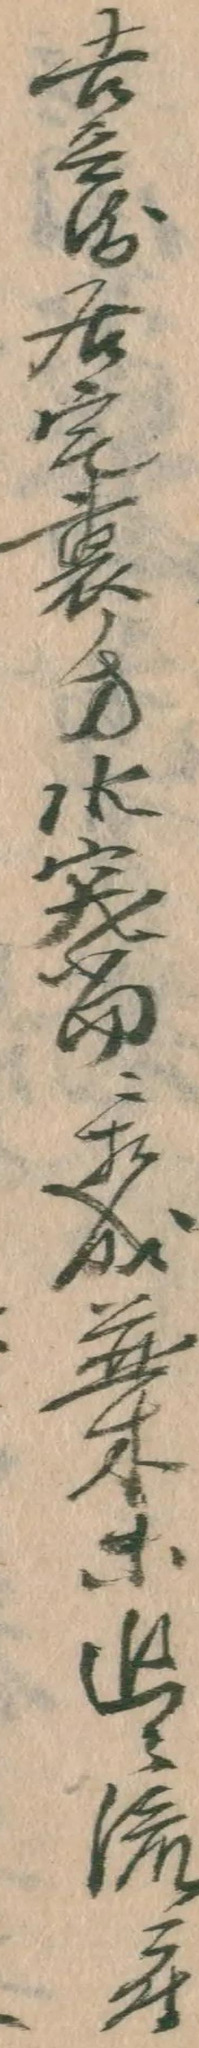吉兵衛居宅裏ノ方水突留二相成並木等追々流ニ付
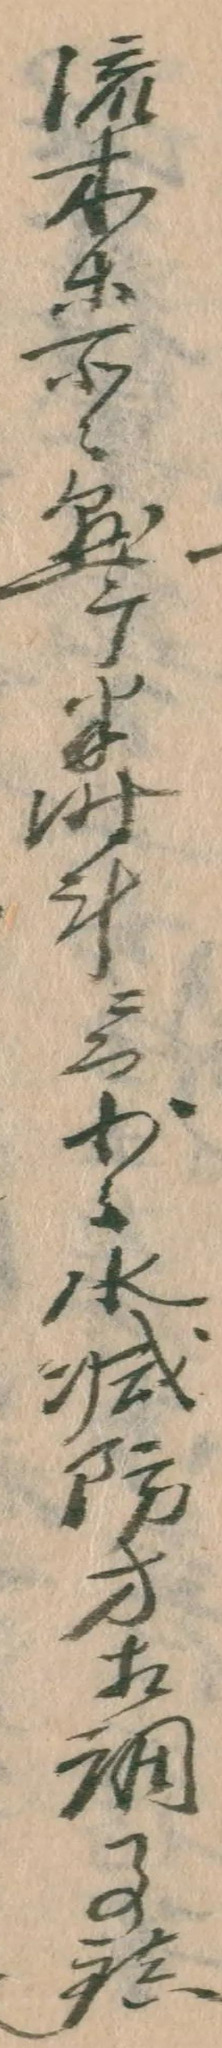流木等所〻懸ケ半時斗ニ而少々水減防方相調事鎮也
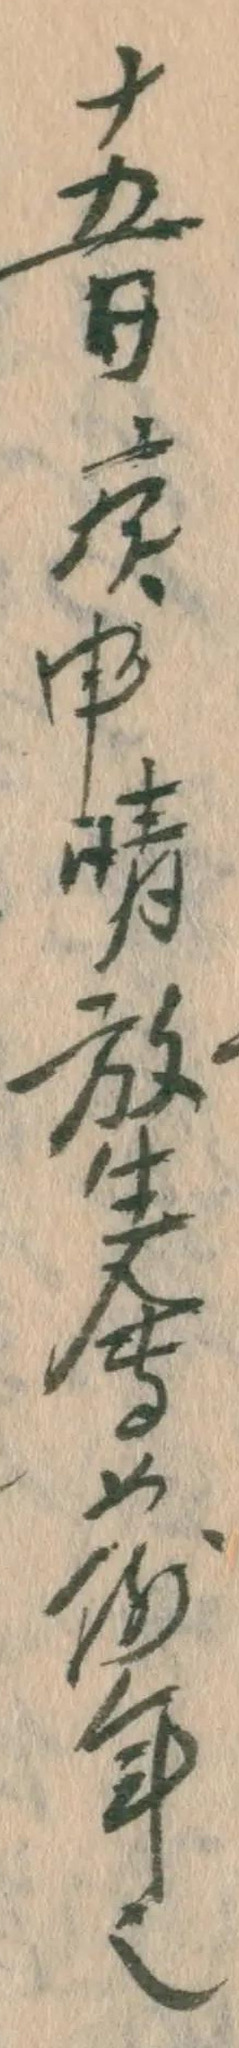十五日庚申晴放生會如例年也
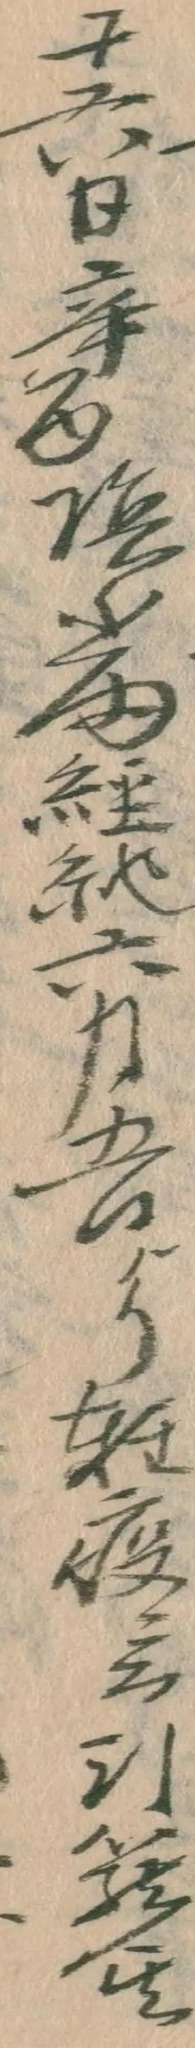十六日辛酉陰小雨経紀六月五日より軽疫ニ而引籠其
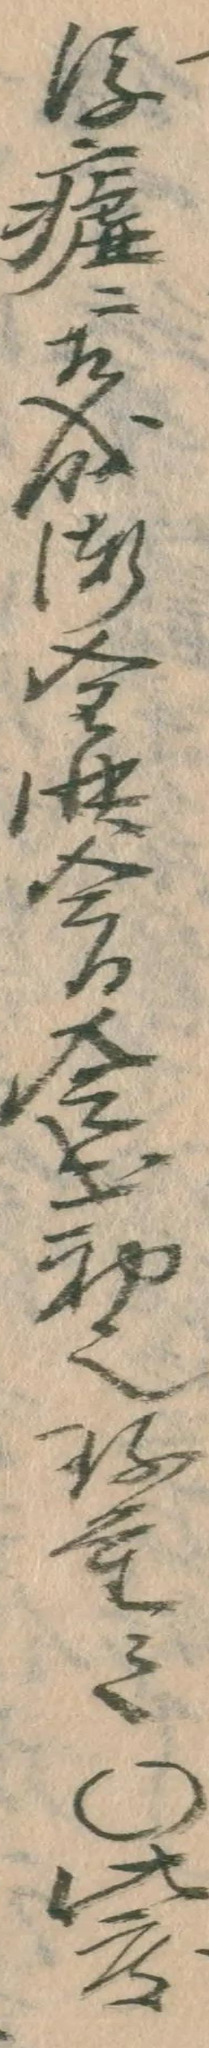後虚ニ相成漸全快今日令出勤也珍重々々○此度
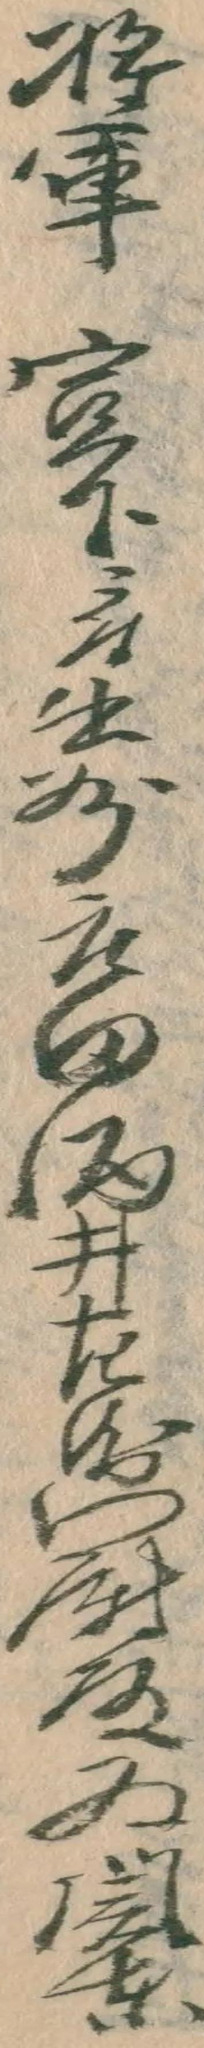将軍宣下ニ付長州庄田酒井左衛門尉殿為関東
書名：賀茂社記録. 第67冊
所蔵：国立国会図書館 National Diet Library, JAPAN
